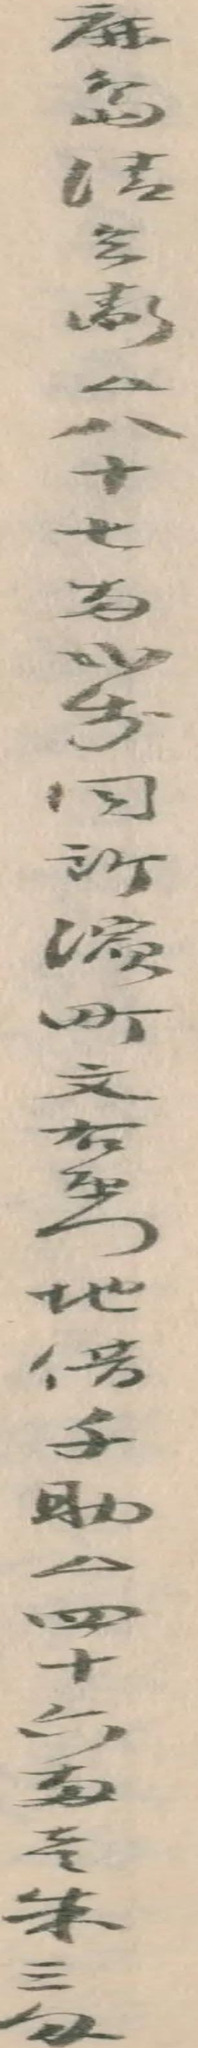鹿島清兵衛△八十七両弐歩同所浜町文右衛門地借千助△四十六両壱朱三匁
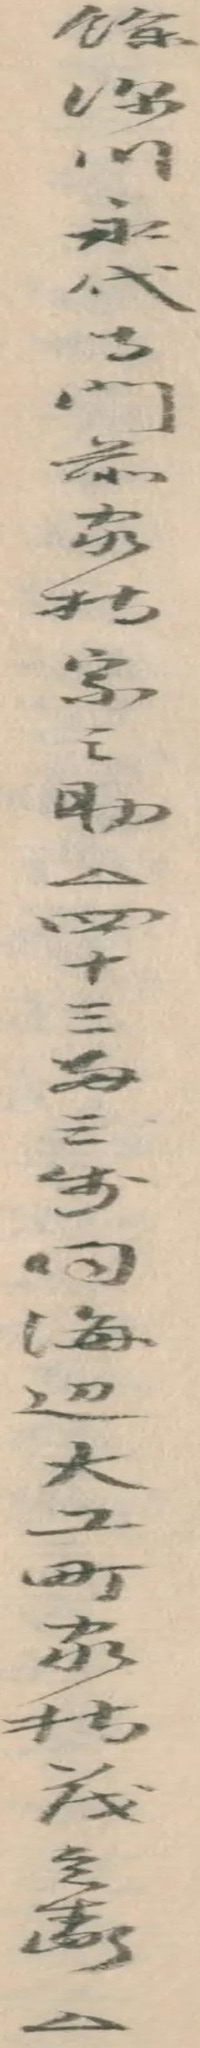余深川永代寺門前家持宗之助△四十三両三歩同海辺大工町家持茂兵衛△

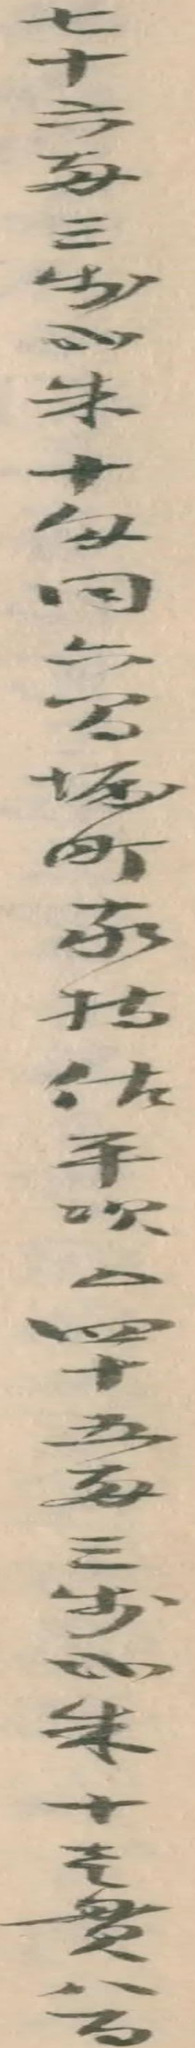七十六両三歩弐朱十匁同六間堀町家持佐平次△四十五両三歩弐朱十壱貫八百
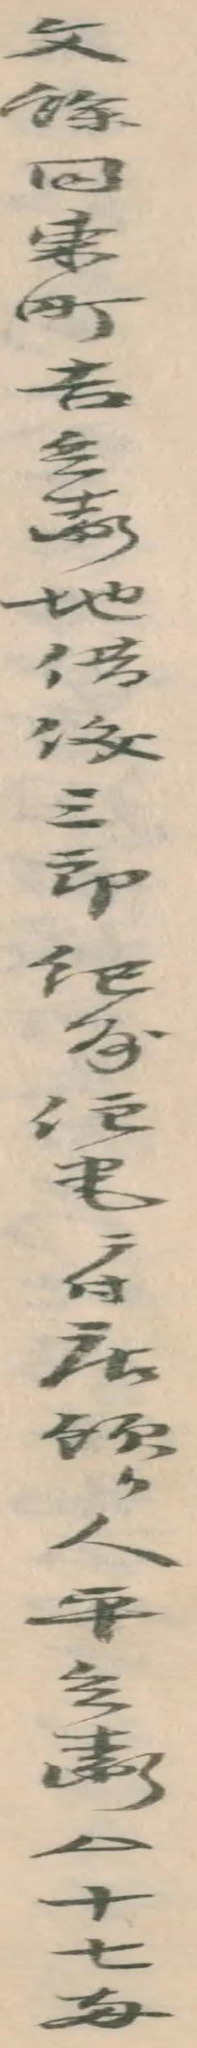文余同東町吉兵衛地借儀三郎紀州住宅付店預り人平兵衛△十七両
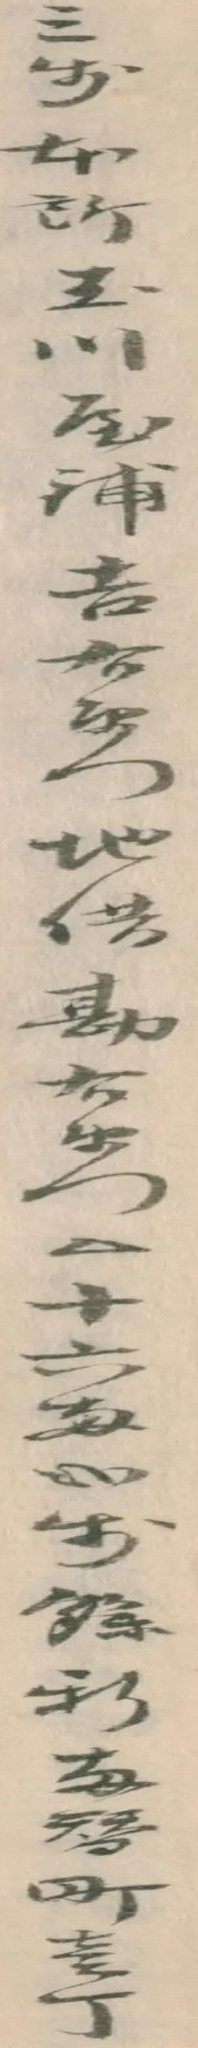三歩本所玉川屋鋪吉右衛門地借勘右衛門△十六両弐歩余新両替町壱丁
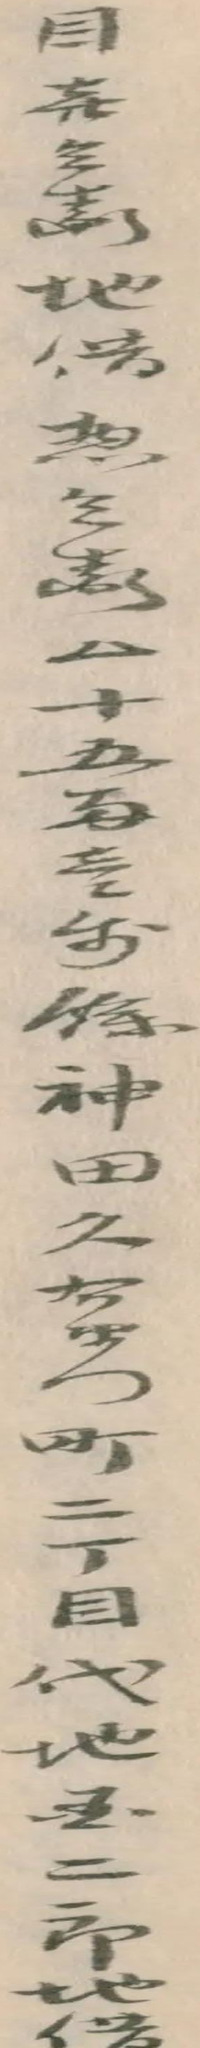目喜兵衛地借惣兵衛△十五両壱歩余神田久右衛門町二丁目代地玉二郎地借
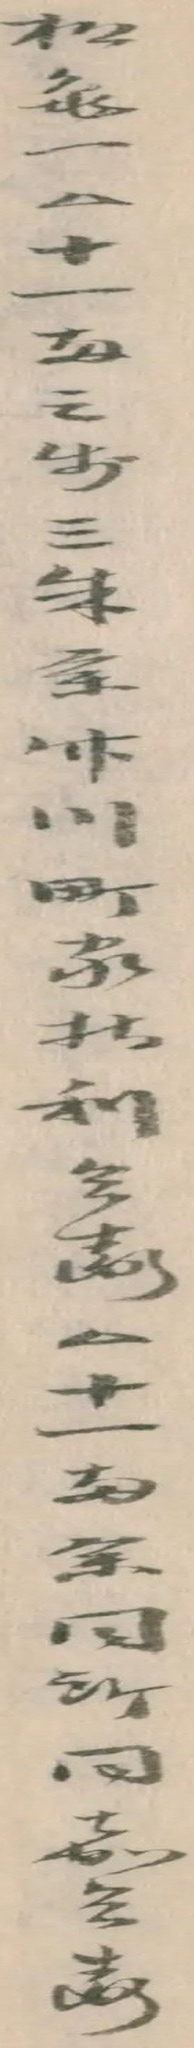松亀一△十一両三歩三朱余竹川町家持利兵衛△十一両余同所同嘉兵衛
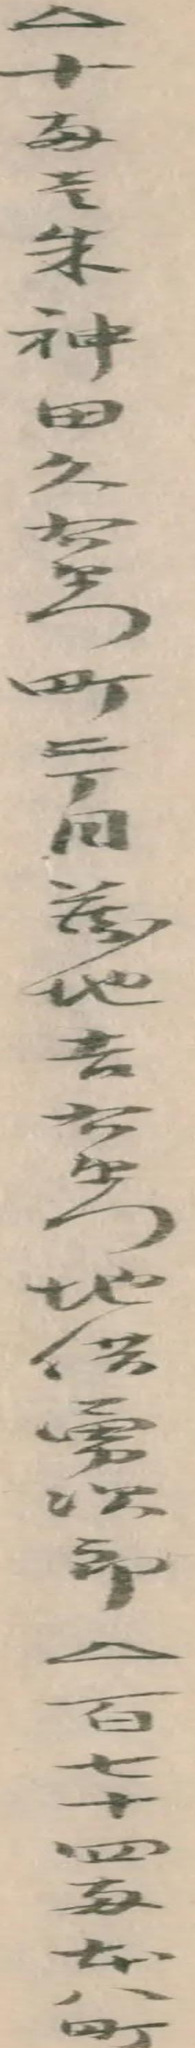△十両壱朱神田久右衛門町二丁目蔵地吉右衛門地借勇次郎△百七十四両本八町
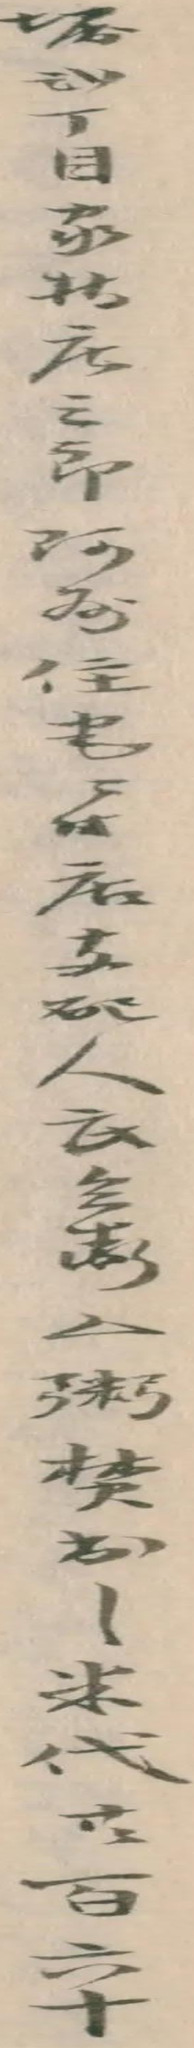堀弐丁目家持庄三郎阿州住宅付店支配人武兵衛△粥焚出し米代共百六十
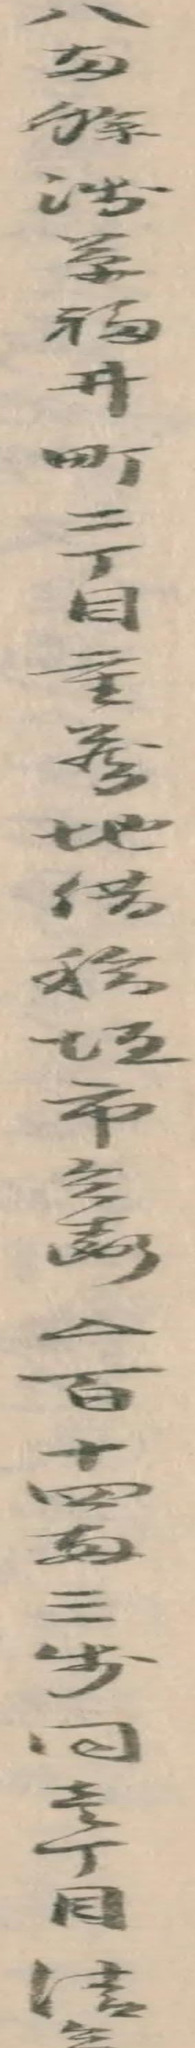八両余浅草福井町二丁目重蔵地借稲垣市兵衛△百十四両三歩同壱丁目清兵
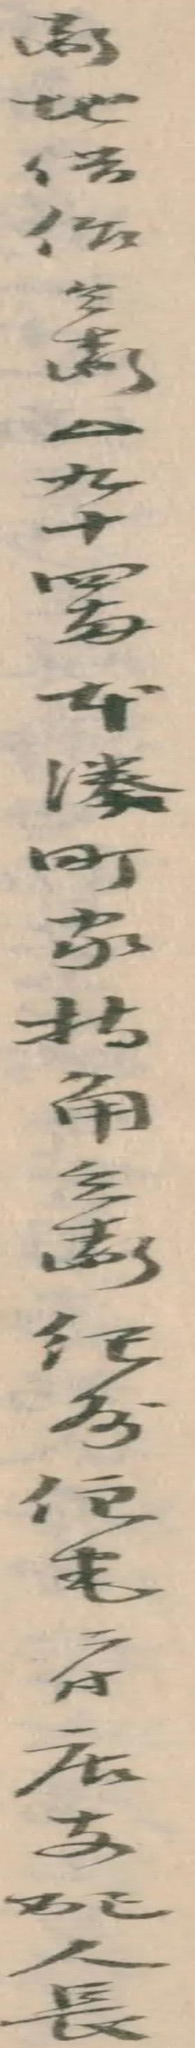衛地借治兵衛△九十四両本湊町家持角兵衛紀州住宅付店支配人長
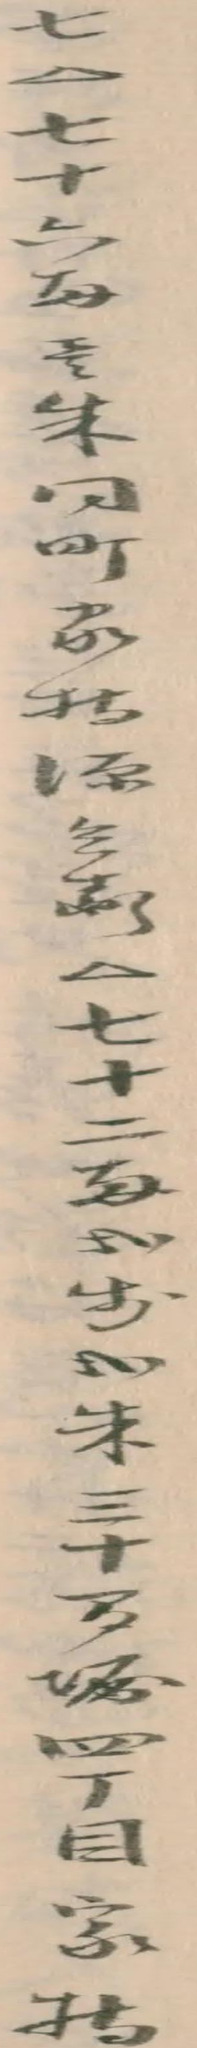七△七十六両壱朱同町家持源兵衛△七十二両弐歩弐朱三十間堀四丁目家持
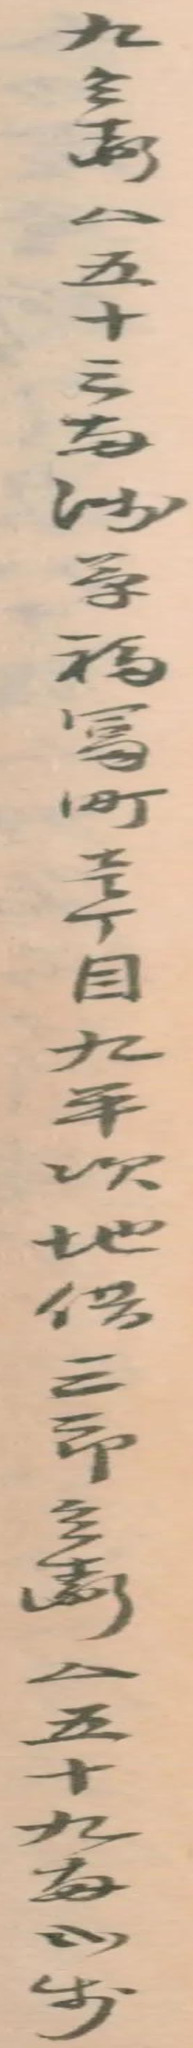九兵衛△五十三両浅草福冨町壱丁目九平次地借三郎兵衛△五十九両弐歩
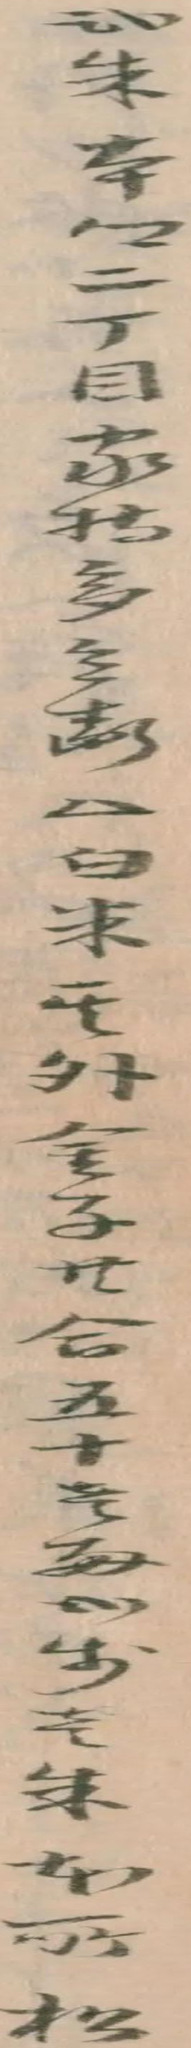弐朱本郷二丁目家持多兵衛△白米其外金子共合五十壱両弐歩壱朱本所松
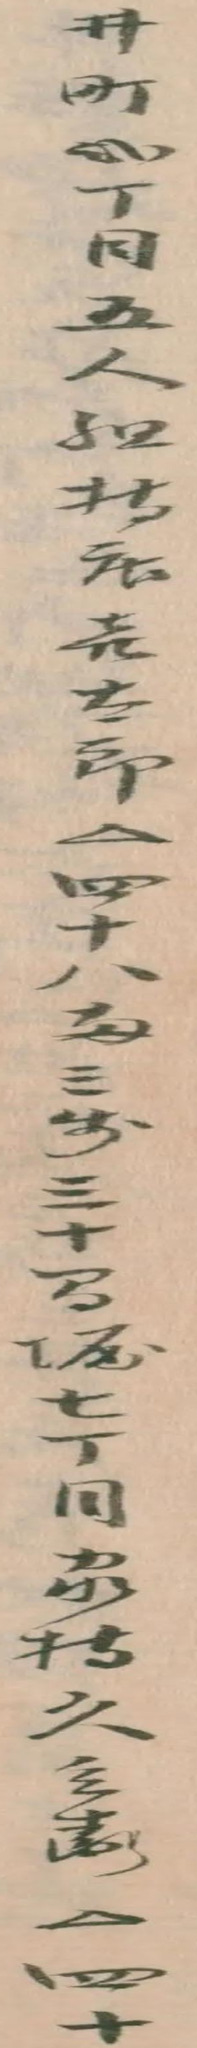井町弐丁目五人組持店喜太郎△四十八両三歩三十間堀七丁目家持久兵衛△四十
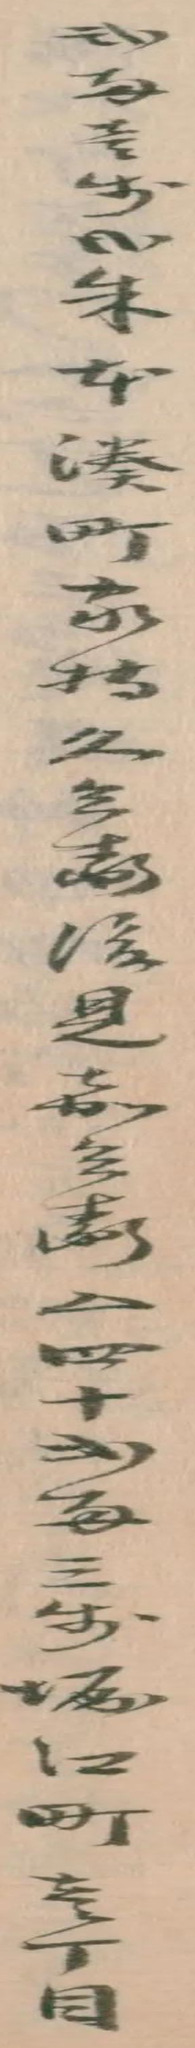弐両壱歩弐朱本湊町家持久兵衛後見嘉兵衛△四十弐両三歩堀江町壱丁目
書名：地災撮要. 巻10(地震之部) 上,下
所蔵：国立国会図書館 National Diet Library, JAPAN
